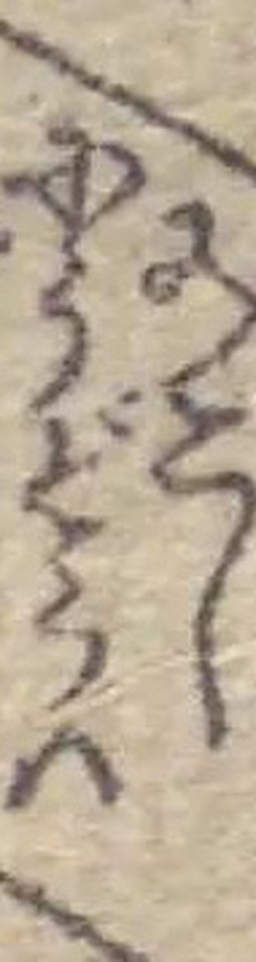にうどうは
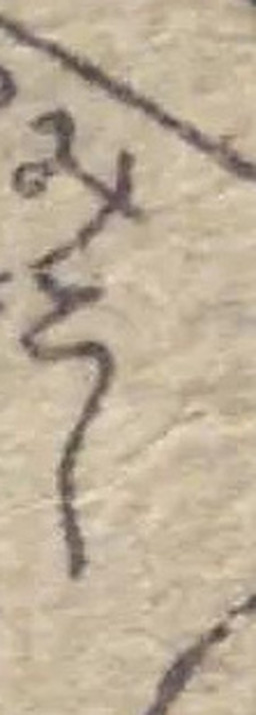みこし
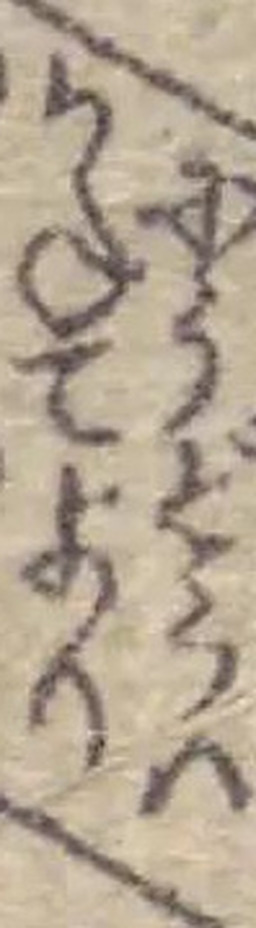かねてより
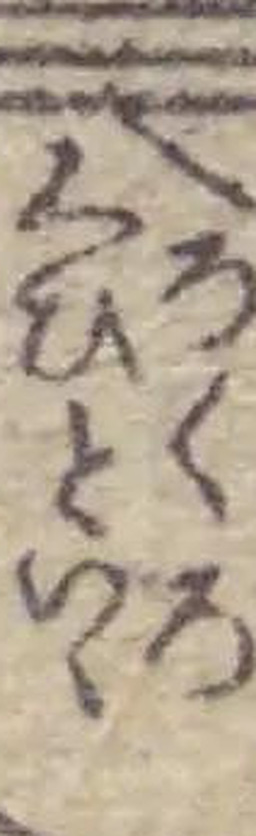くひといゝ
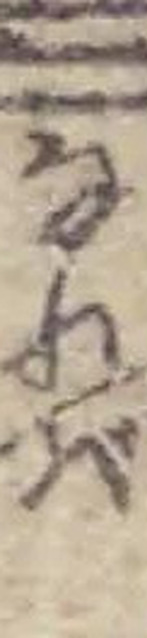ければ
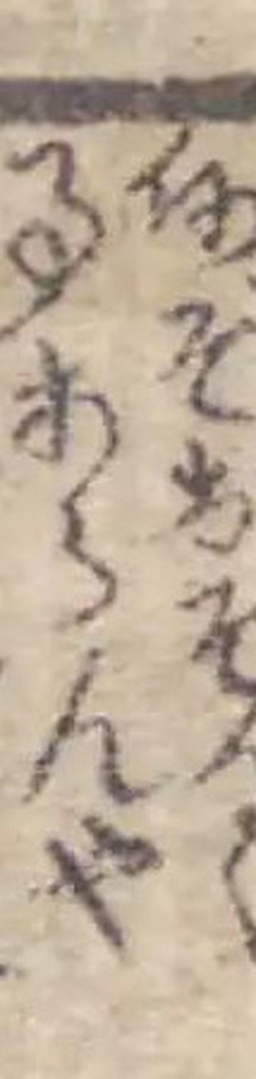事あらんや
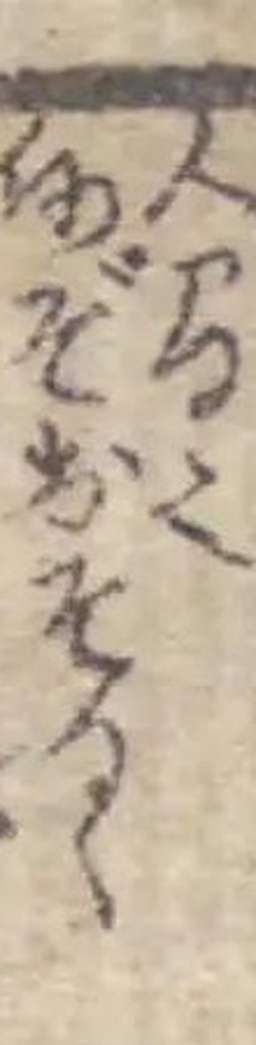何ぞおそるゝ
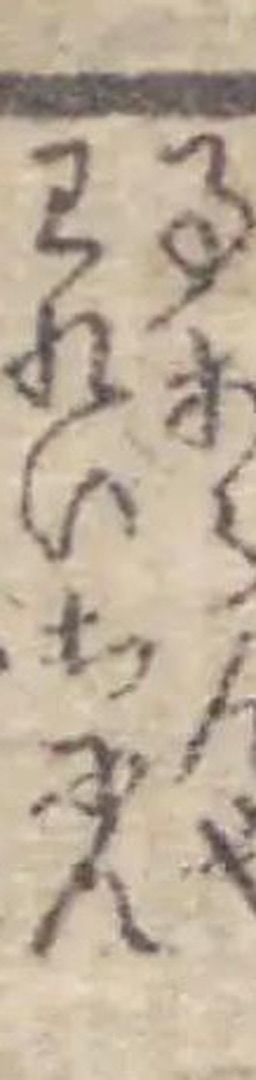われいちにん
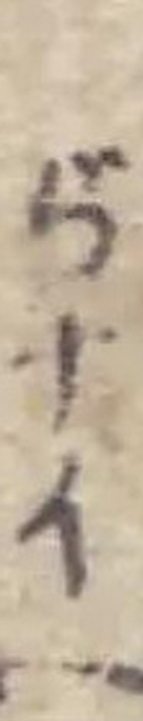がナイ
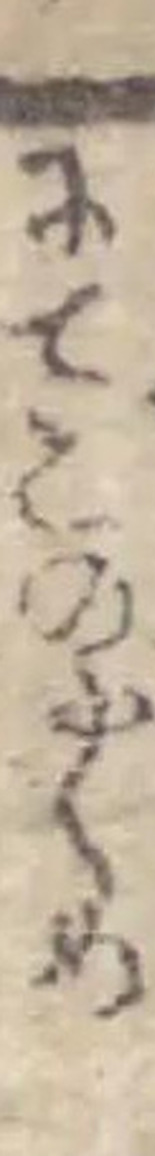にてこのやくめ
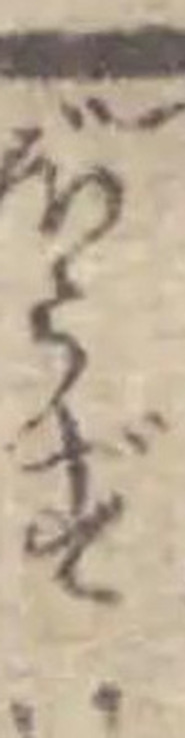ぼうず

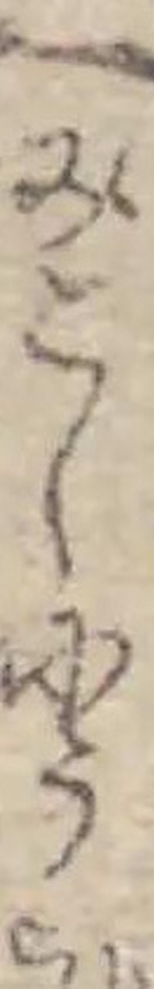みこしにう
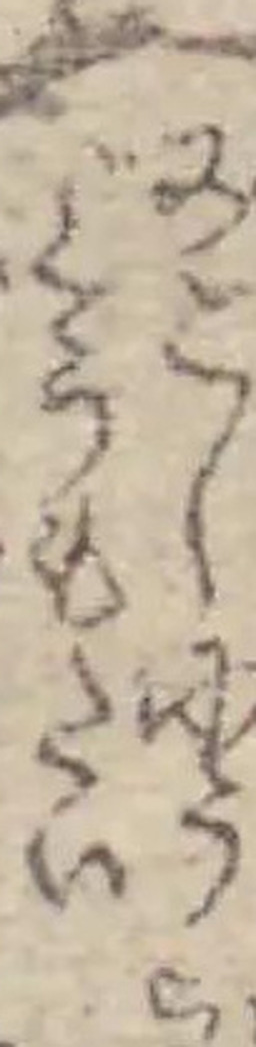どうもたい
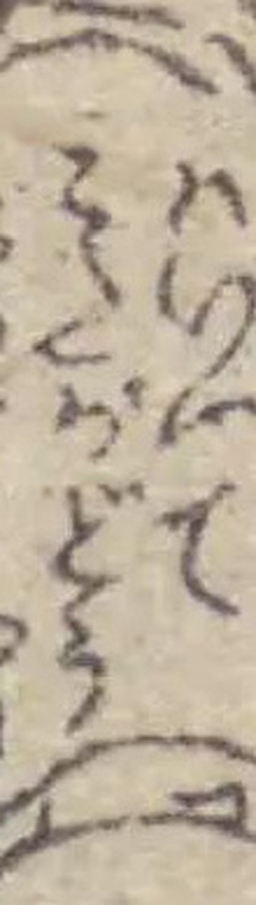みたがどう
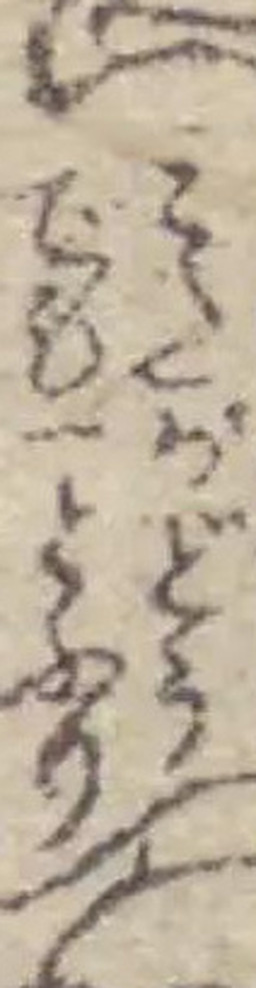でも一とふり
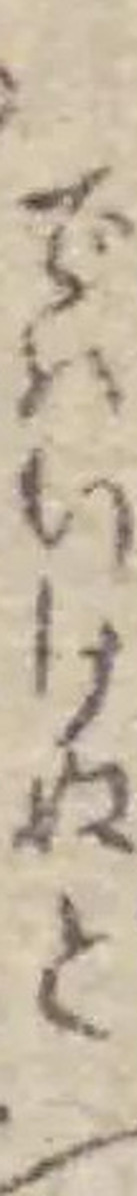ではいけぬと
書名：化物尽 4巻
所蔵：国立国会図書館 National Diet Library, JAPAN
